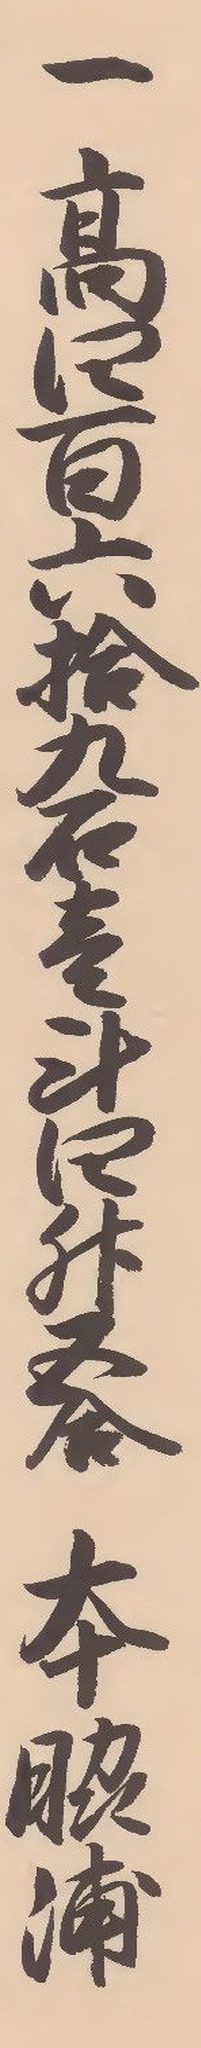一高四百六拾九石壱斗四升五合本脇浦
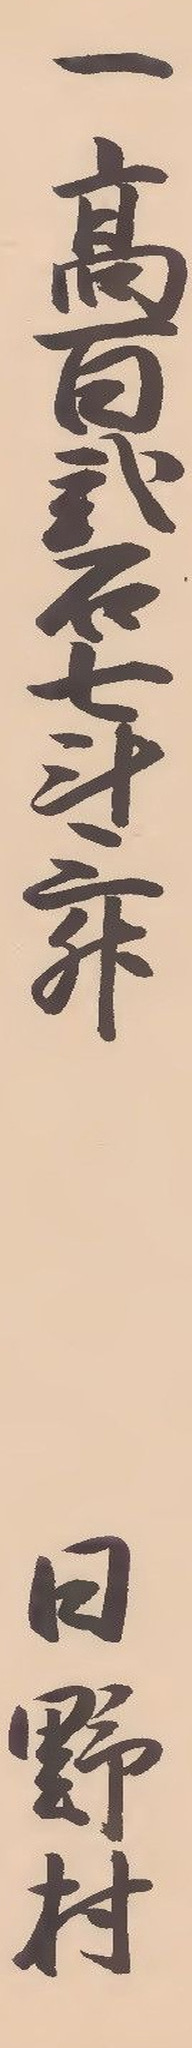一高百弐石七斗三升日野村
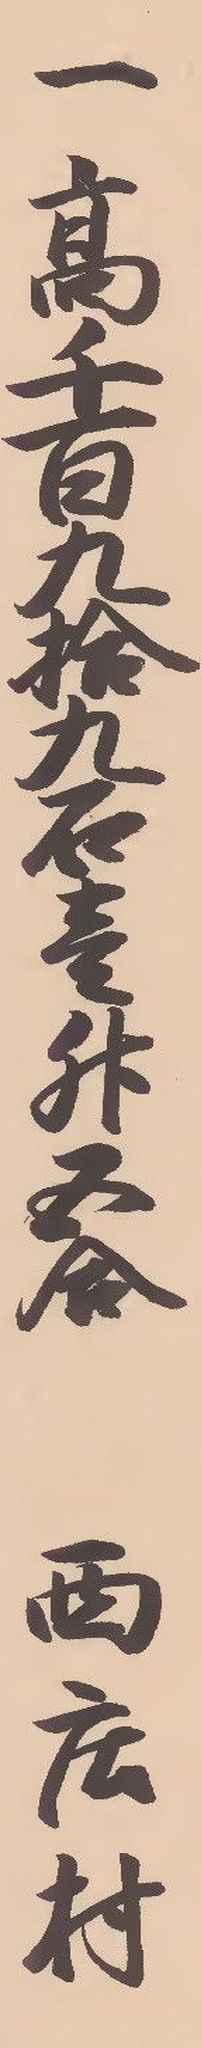一高千百九拾九石壱升五合西庄村
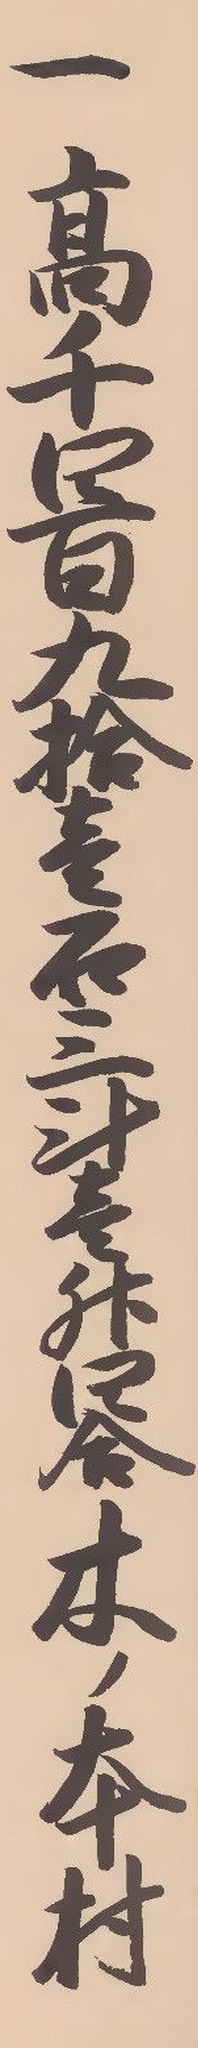一高千四百九拾壱石三斗壱升四合木ノ本村
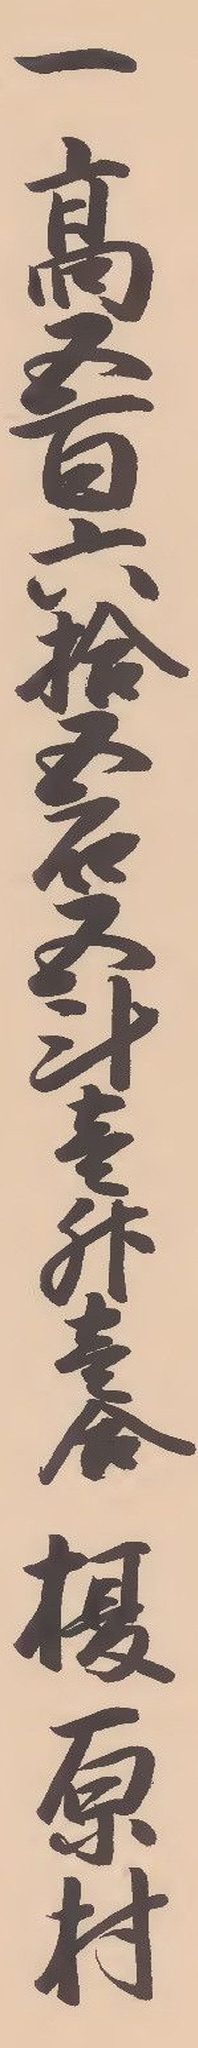一高五百六拾五石五斗壱升壱合榎原村
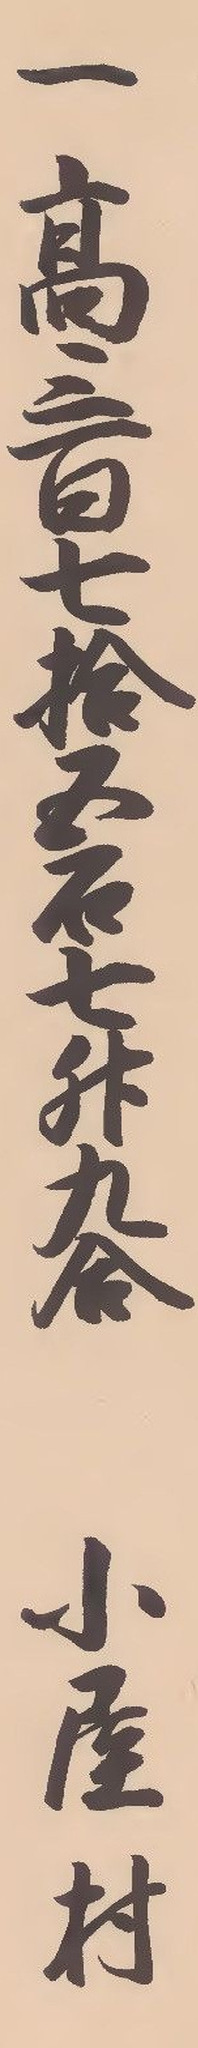一高三百七拾五石七升九合小屋村
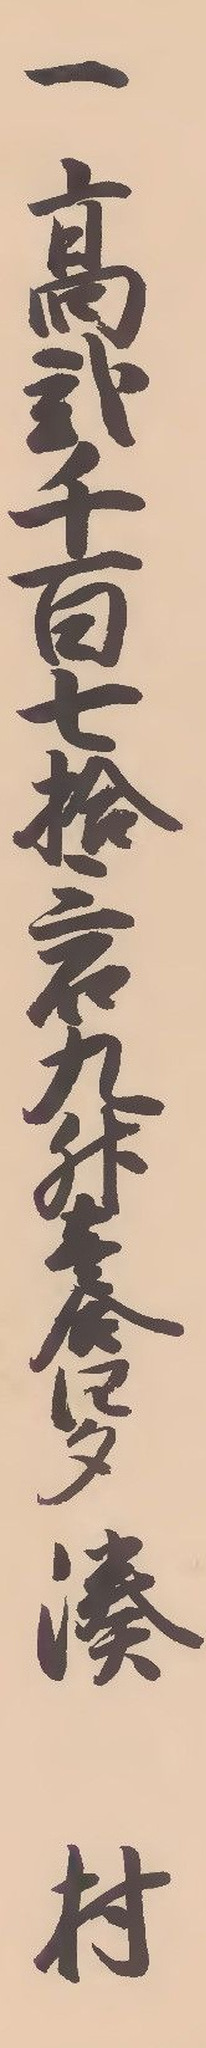一高弐千百七拾三石九升壱合四勺湊村

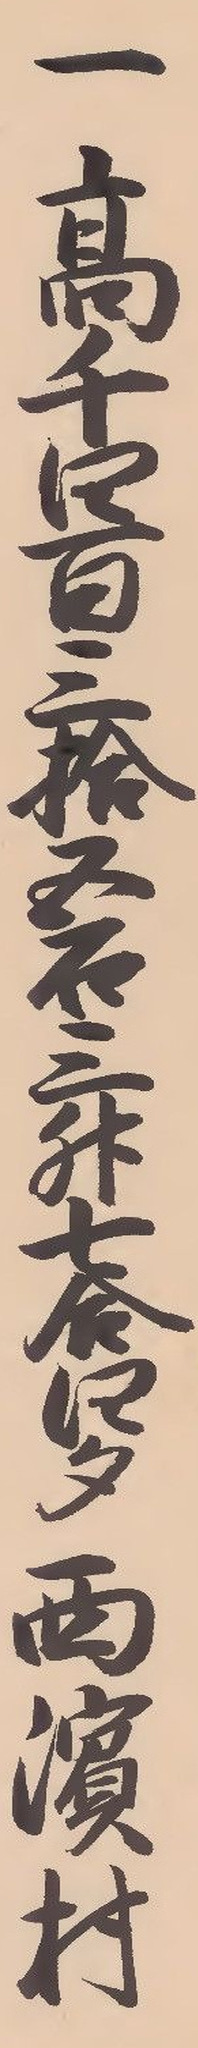一高千四百三拾五石三升七合四勺西浜村
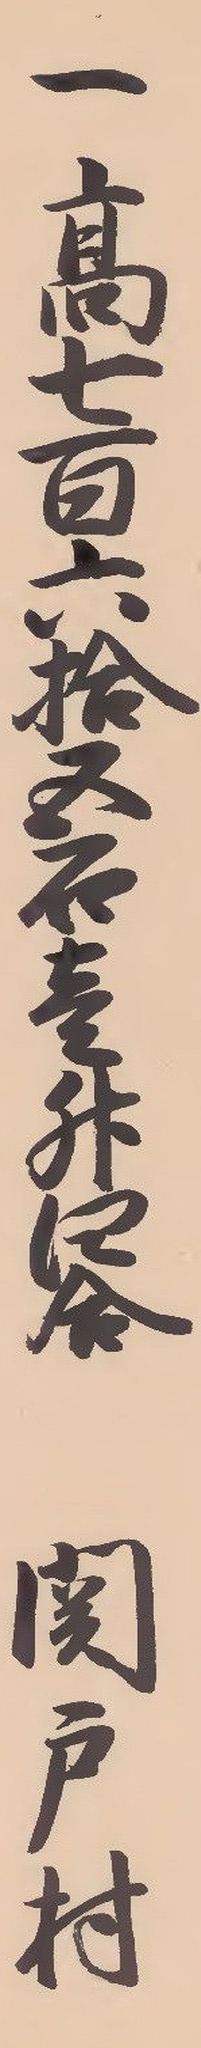一高七百六拾五石壱升四合関戸村
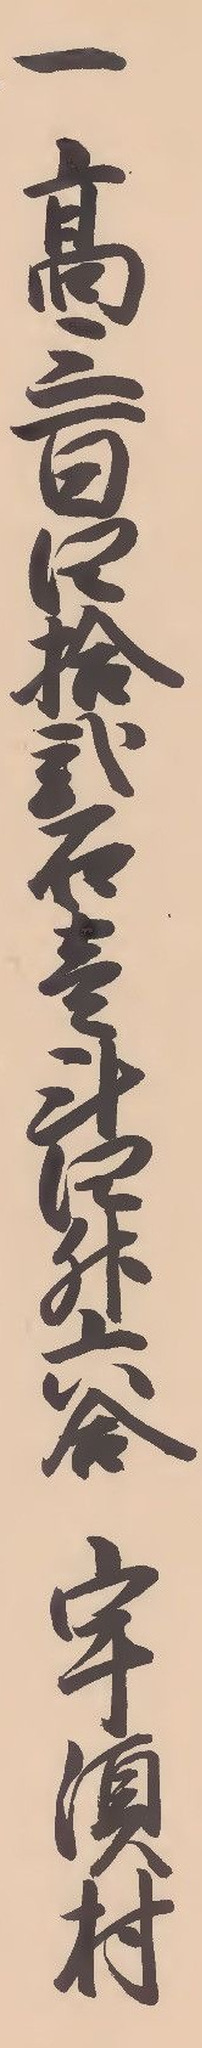一高三百四拾弐石壱斗四升六合宇須村
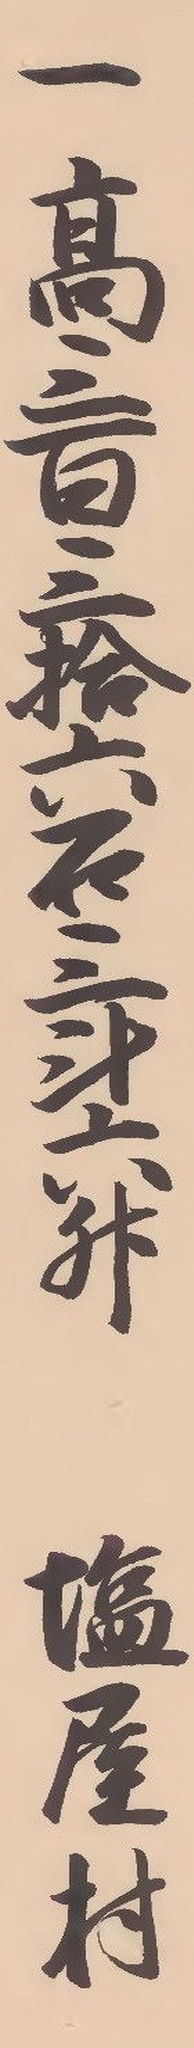一高三百三拾六石三斗六升塩屋村
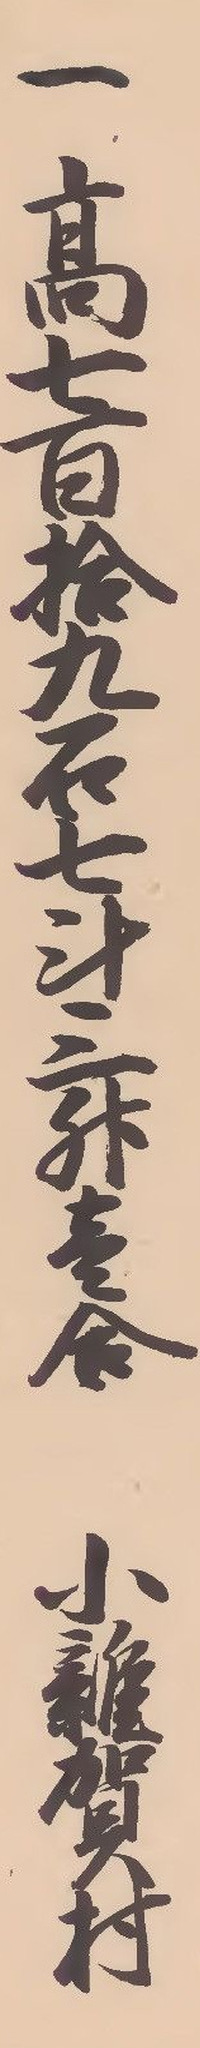一高七百拾九石七斗三升壱合小雑賀村

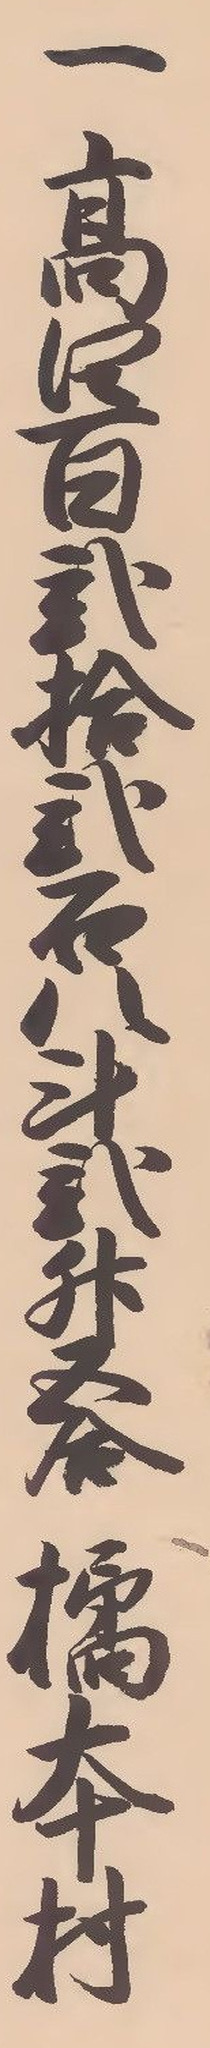一高四百弐拾弐石八斗弐升五合橘本村
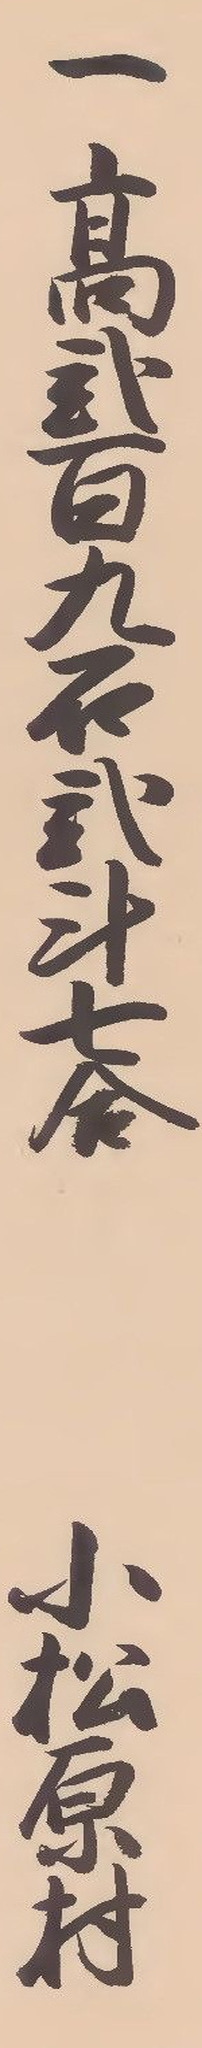一高弐百九石弐斗七合小松原村
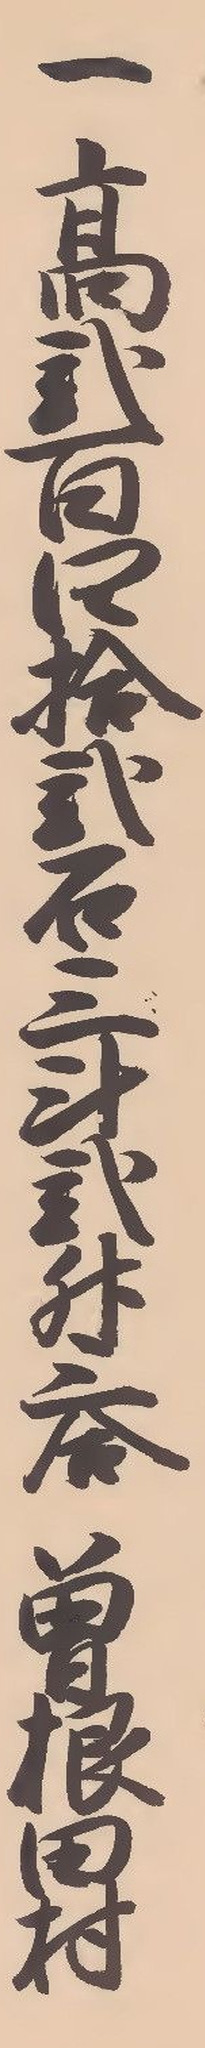一高弐百四拾弐石三斗弐升三合曽根田村
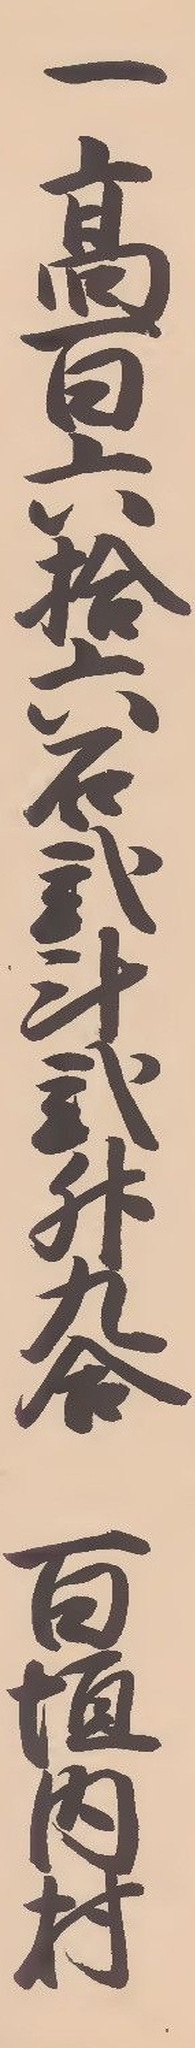一高百六拾六石弐斗弐升九合百垣内村
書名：紀伊国郷帳
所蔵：国立公文書館 National Archives of Japan
